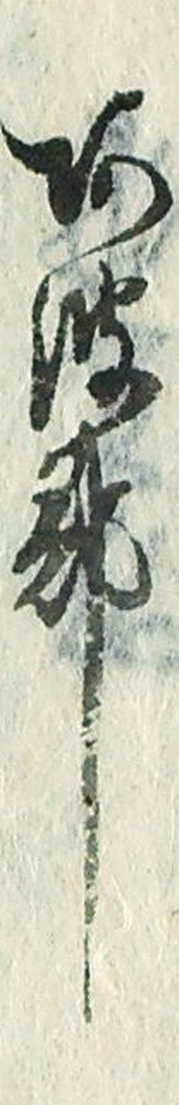阿波郡
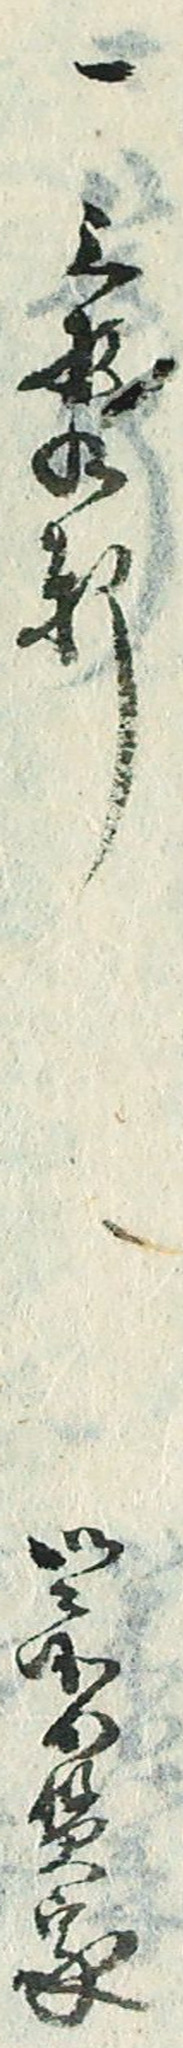一五拾四軒以前ゟ質家
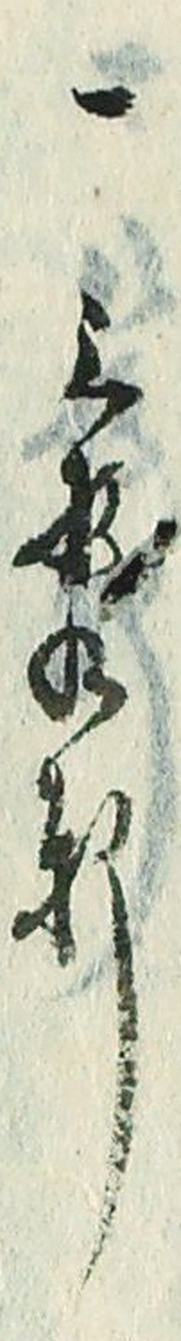一三拾九軒
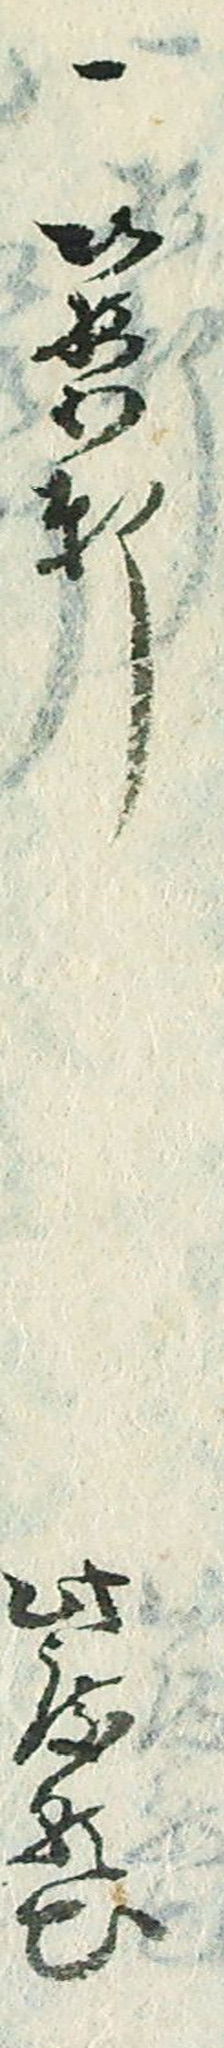一拾五軒此度願出
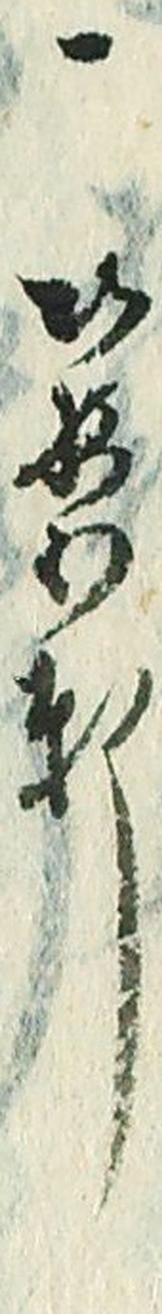一三拾九軒
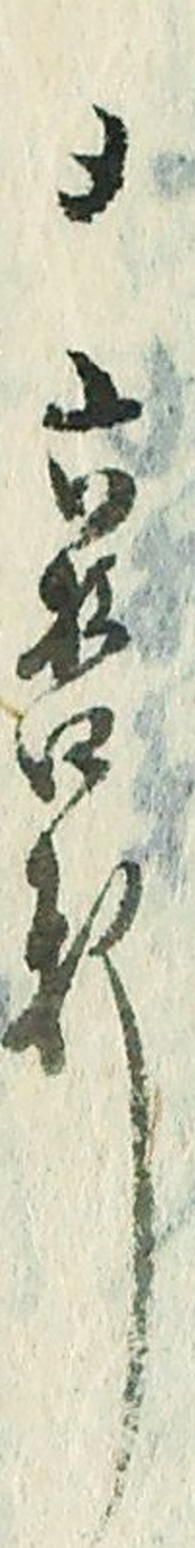〆六拾三軒
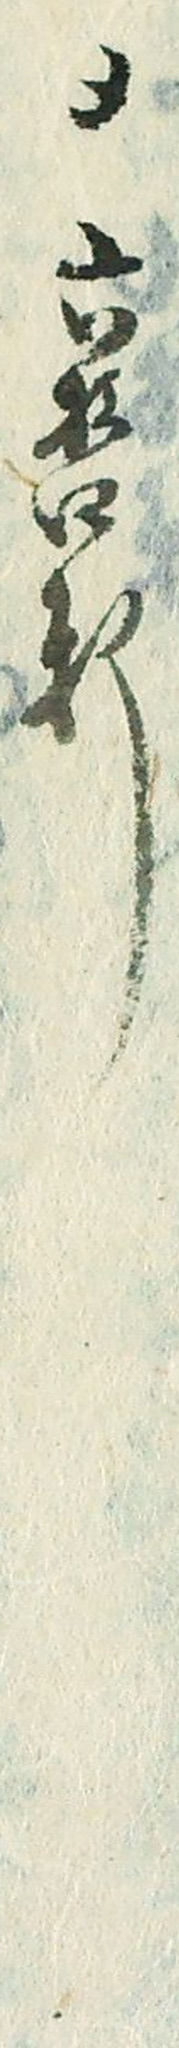〆六拾三軒
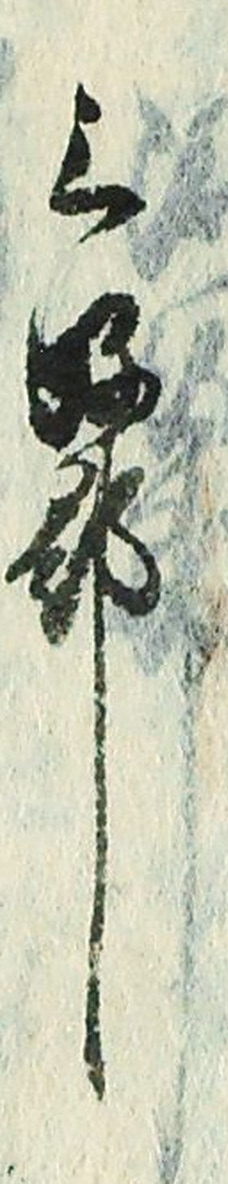三好郡
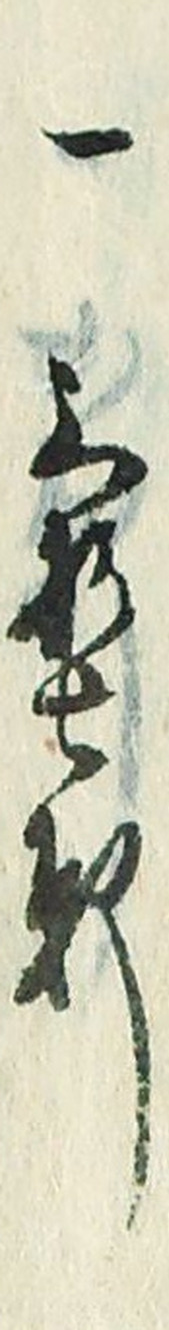一三拾七軒
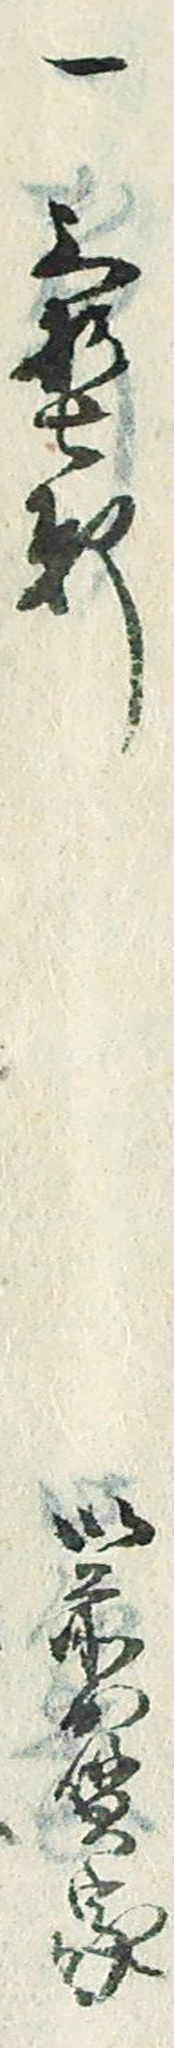一五拾四軒以前ゟ質家
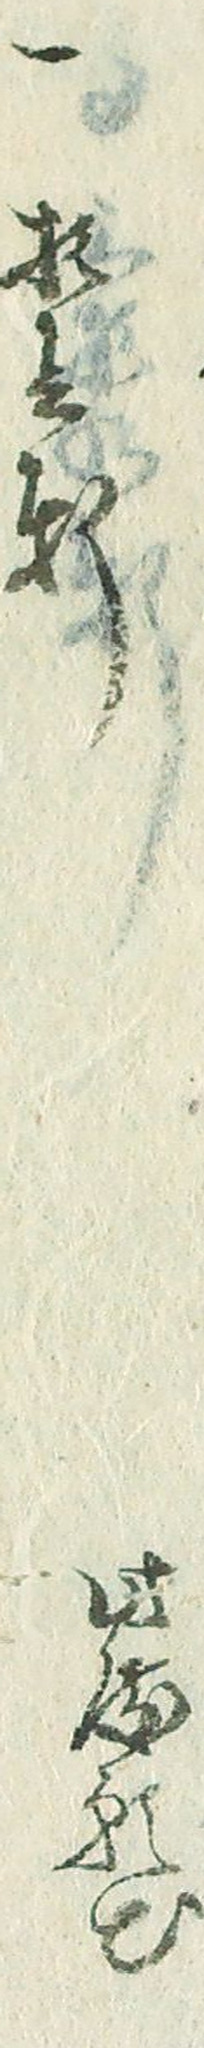一拾五軒此度願出
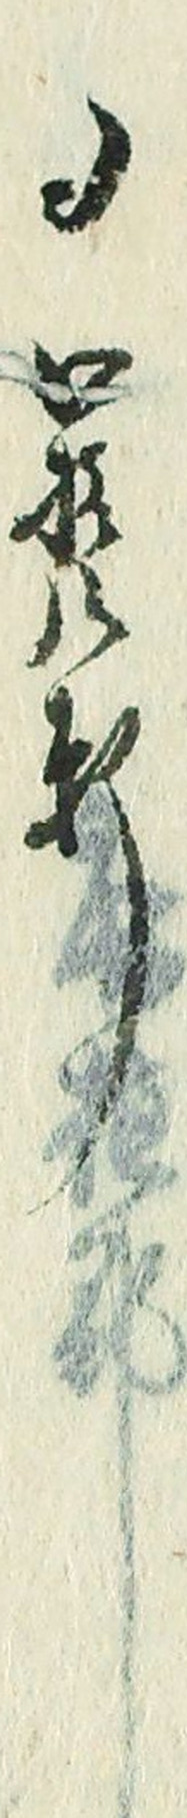〆六拾三軒
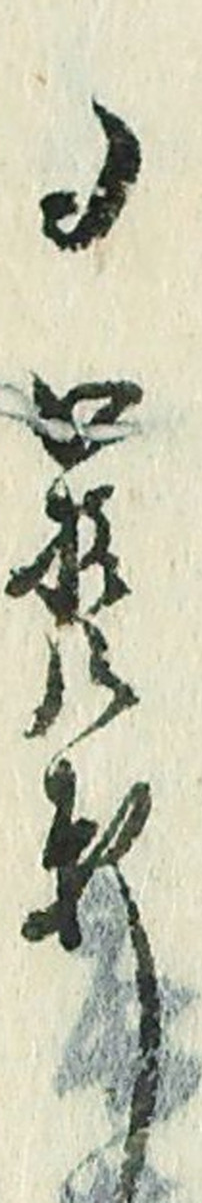〆六拾三軒
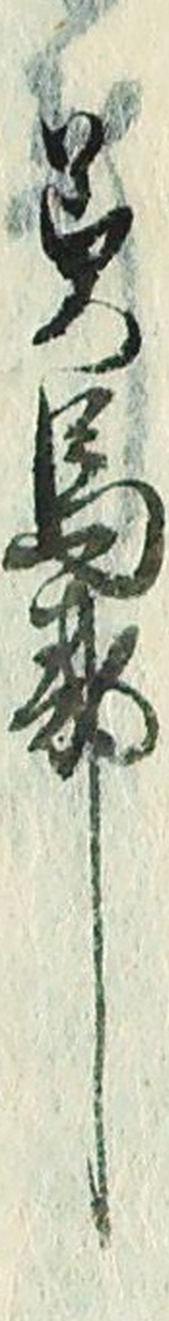美馬郡
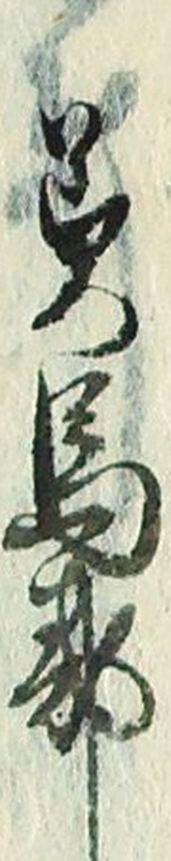美馬郡
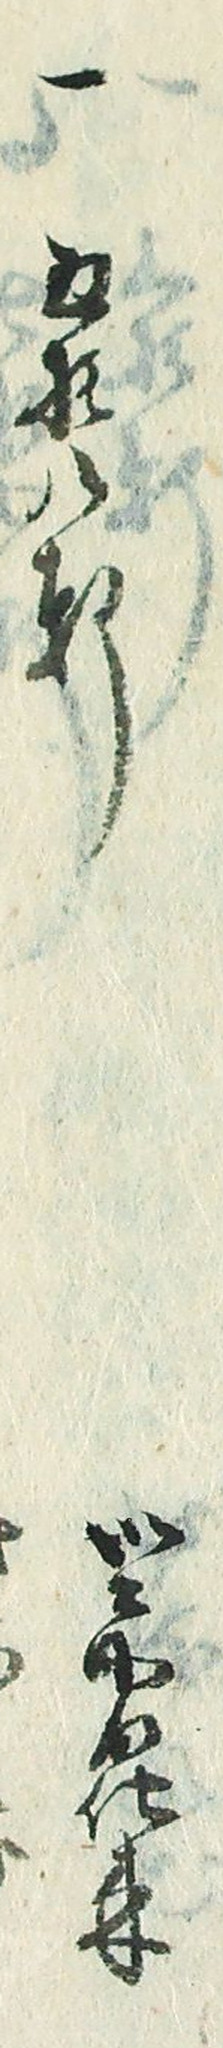一五拾八軒以前ゟ仕来
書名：市郷質屋株御取究並御書出御趣法之写
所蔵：鳴門教育大学 Naruto University of Education
